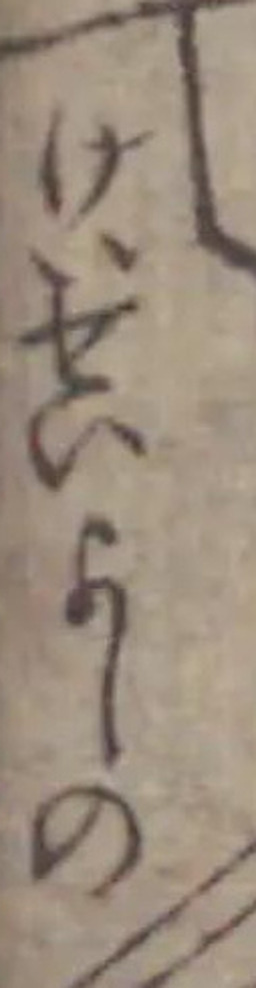けいせいよしの
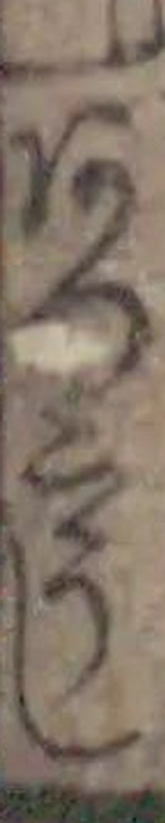あつこうし
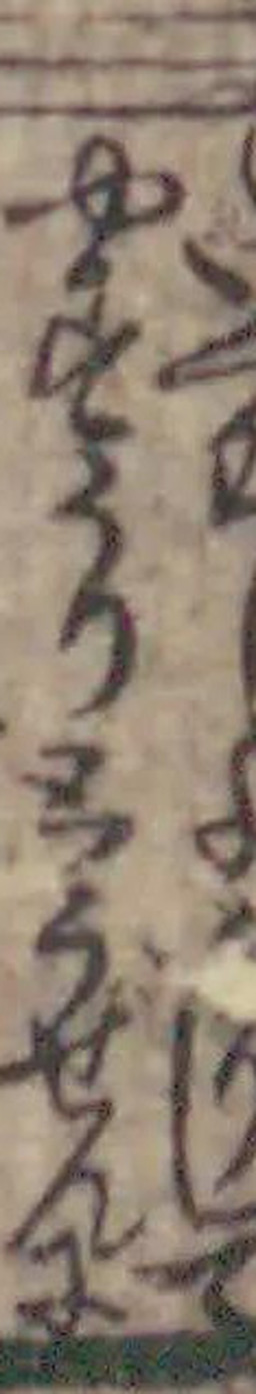やすうりとうせんに
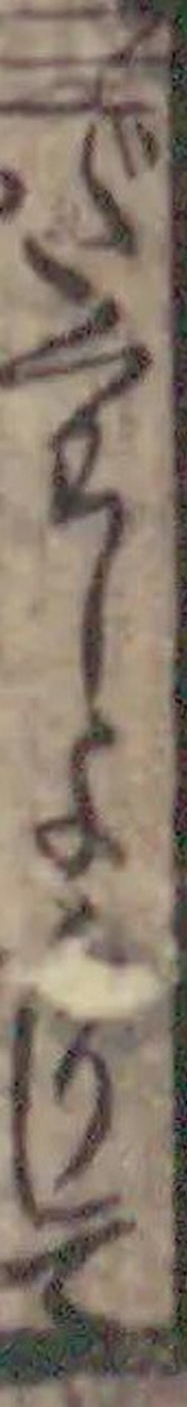だくわしにりして
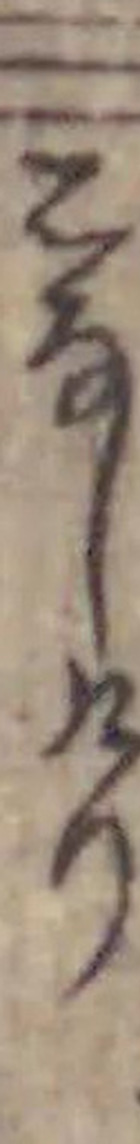こなしけり
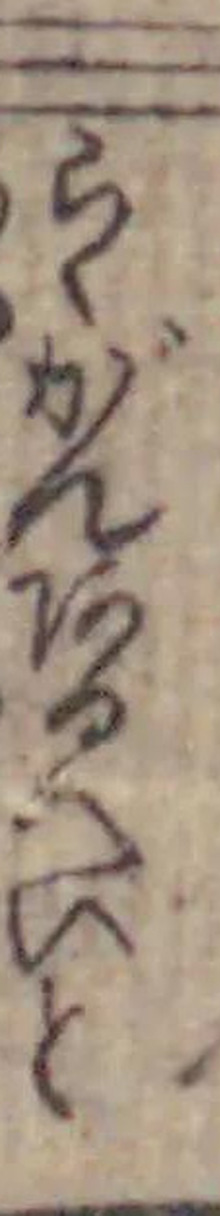らくがんあるへいと
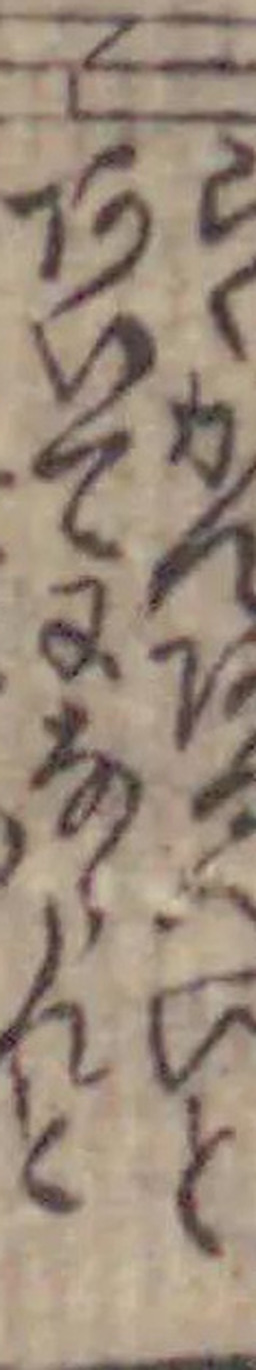あいてにならんと
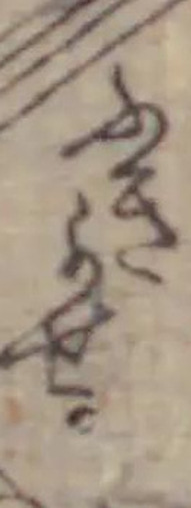ふきよせ
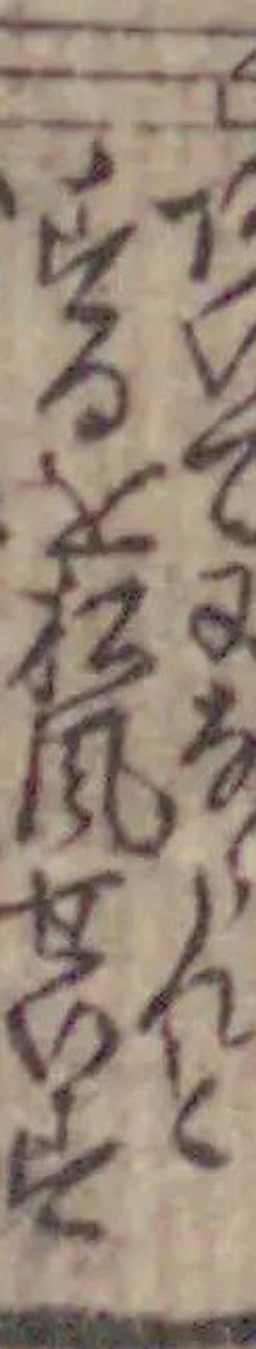するを松風せいす
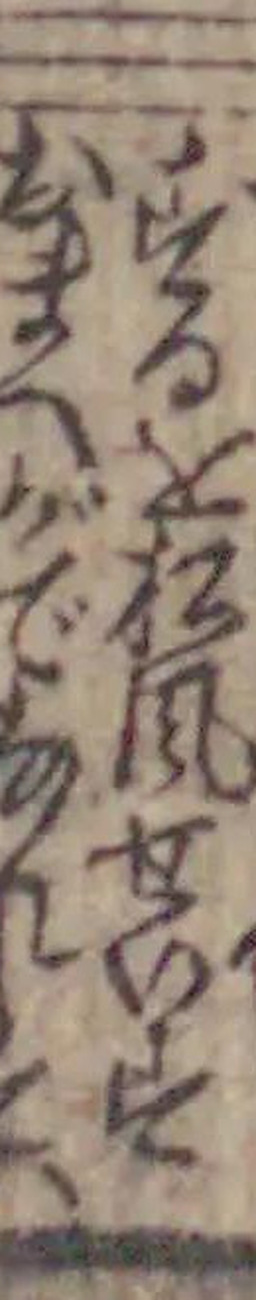おまへがでなんしては
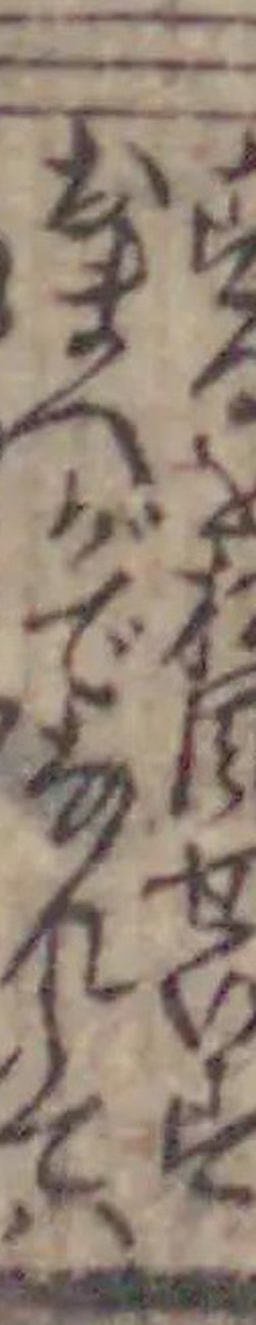おまへがでなんしては
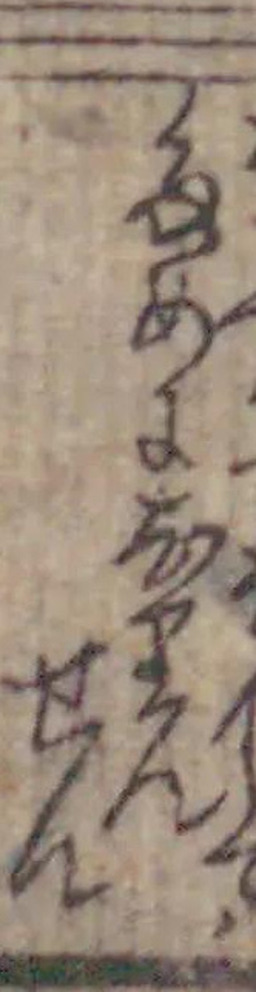ためになりん
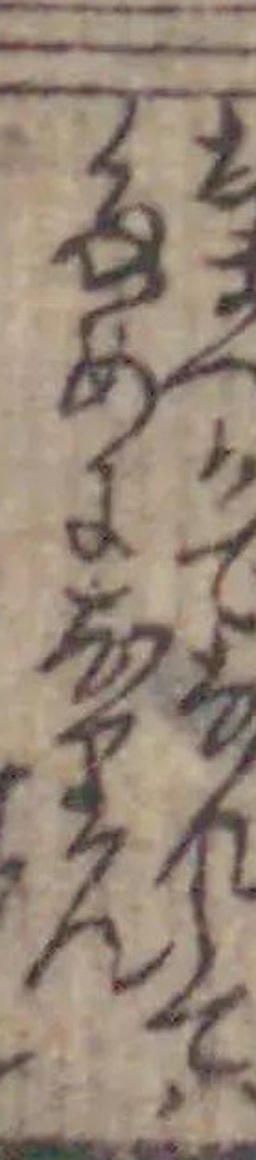ためになりん
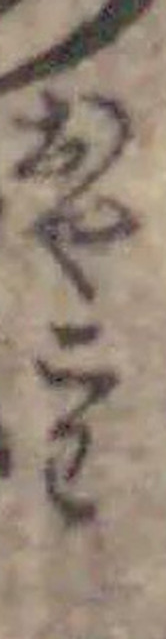おやこわ
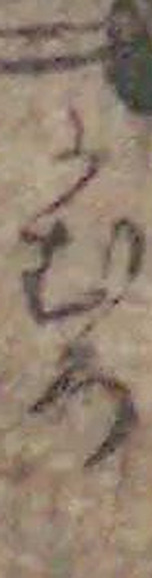かむろ

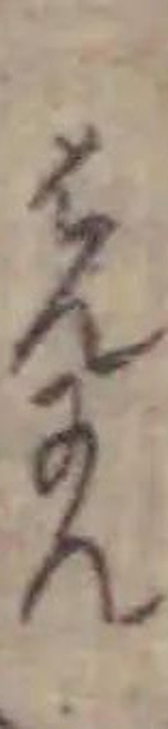はんにん
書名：名代干菓子山殿 3巻
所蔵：国立国会図書館 National Diet Library, JAPAN
